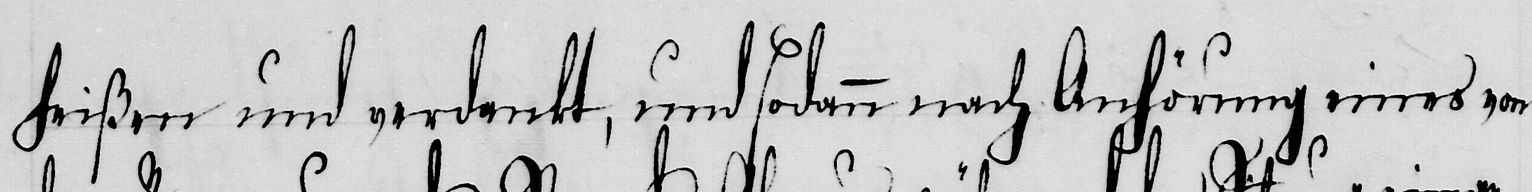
heißen und verdankt, und sodann nach Anhörung eines
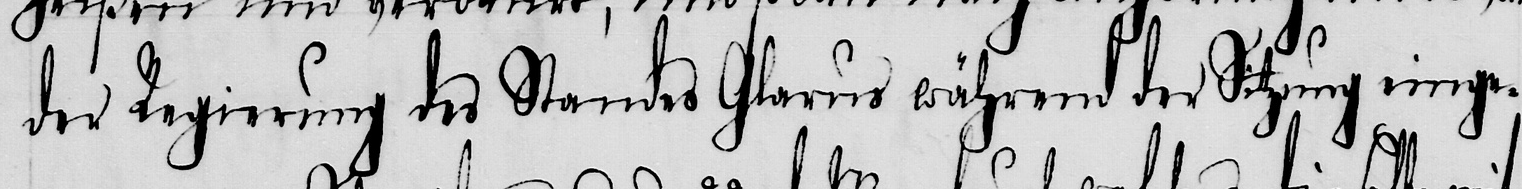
der Regierung des Standes Glarus während der Sitzung einge¬
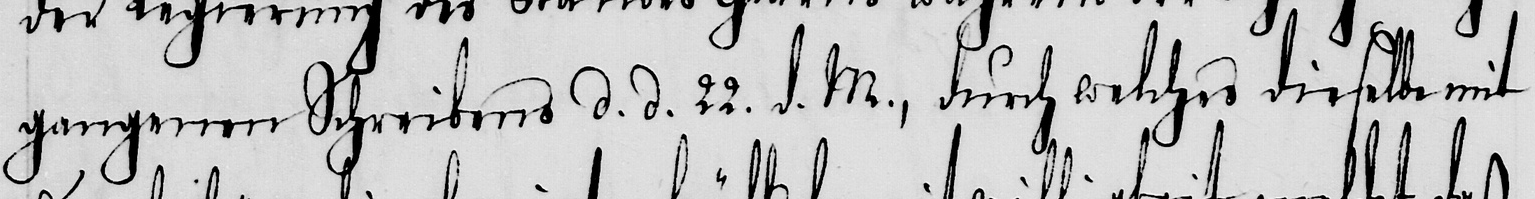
gangenen Schreibens d. d. 22. d. M., durch welches dieselbe mit
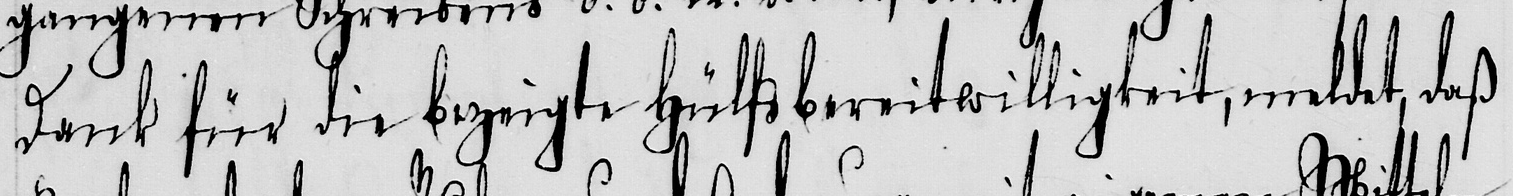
Dank für die bezeigte Hülfsbereitwilligkeit, meldet, daß
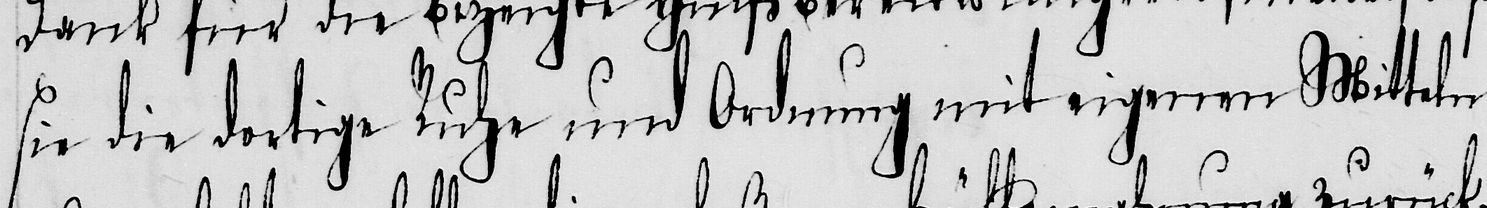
sie die dortige Ruhe und Ordnung mit eigenen Mitteln
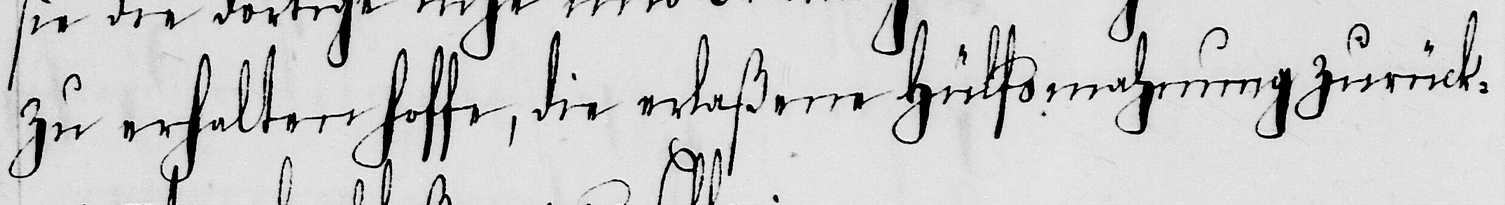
zu erhalten hoffe, die erlaßene Hülfsmahnung zurück¬
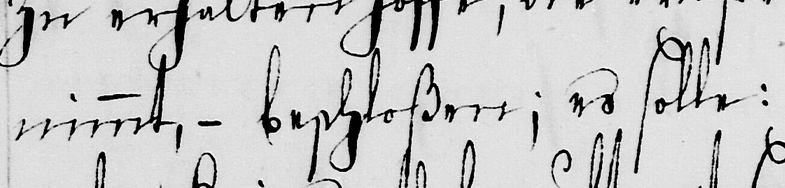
nimmt, – beschloßen; es solle:
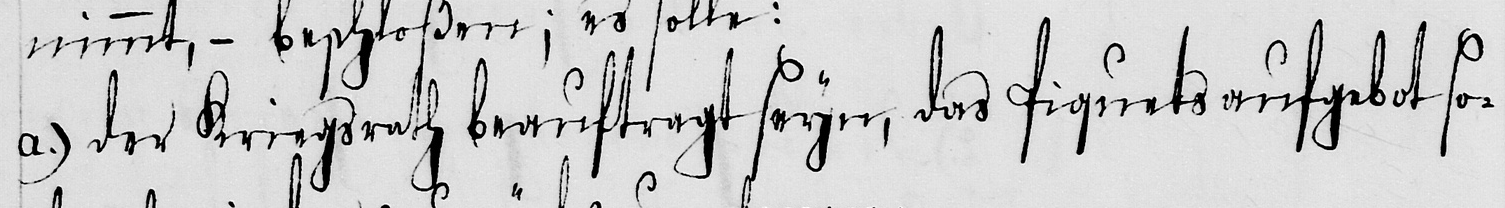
a.) der Kriegsrath beauftragt seyn, das Piquetsaufgebot so¬
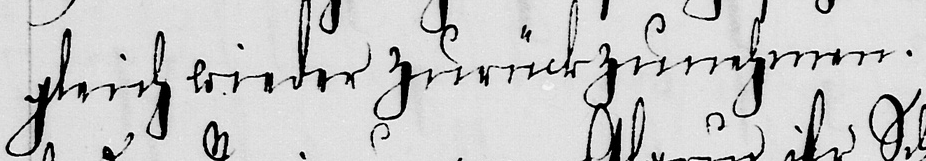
gleich wieder zurückzunehmen.
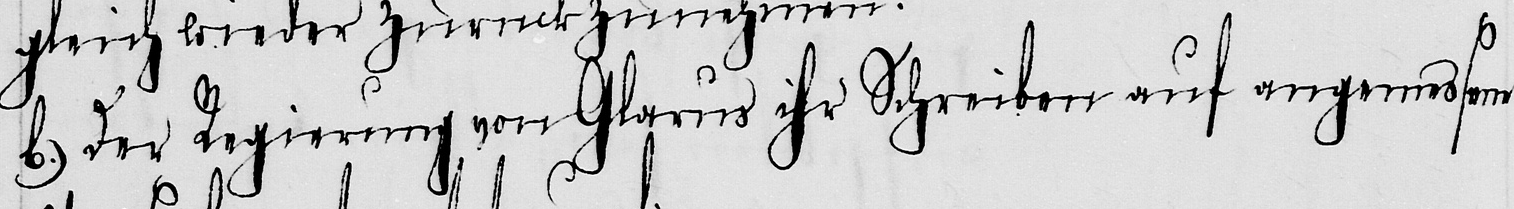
b.) Der Regierung von Glarus ihr Schreiben auf angemeßene
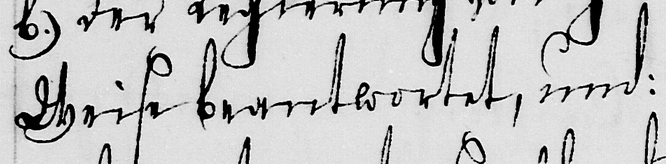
Weise beantwortet, und:
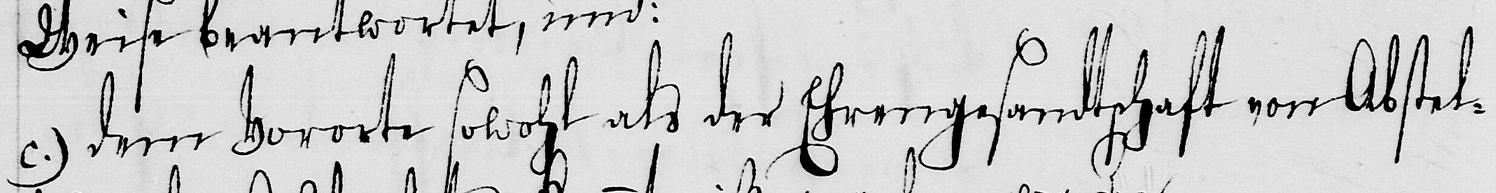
c.) dem Vororte sowohl als der Ehrengesandtschaft von Abste¬
